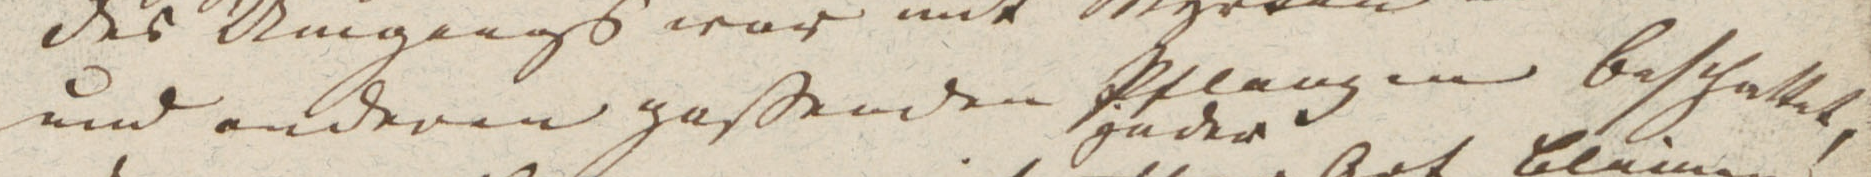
und anderen passenden Pflanzen beschattet.,
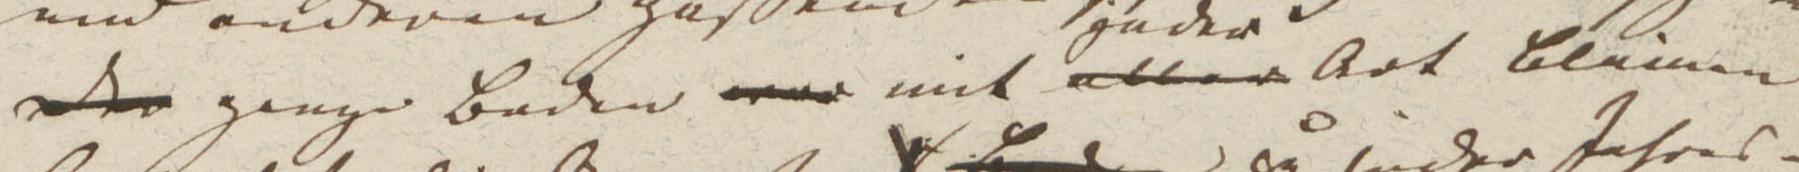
Der ganze Boden war mit aller jeder Art Blumen
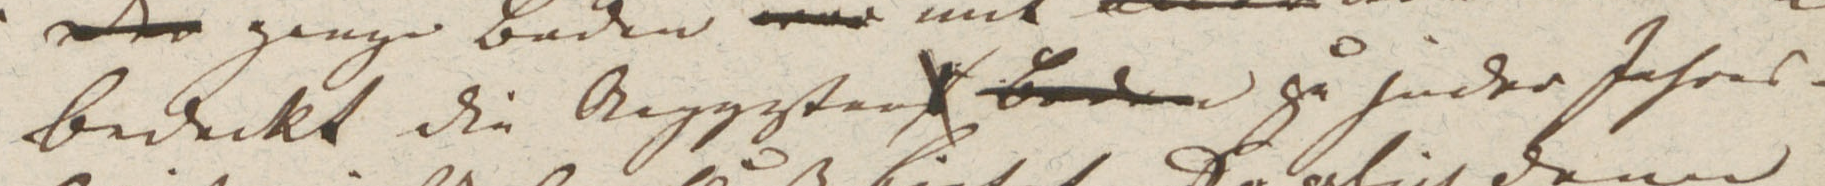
bedeckt die Aegyptens Boden zu jeder Jahres-
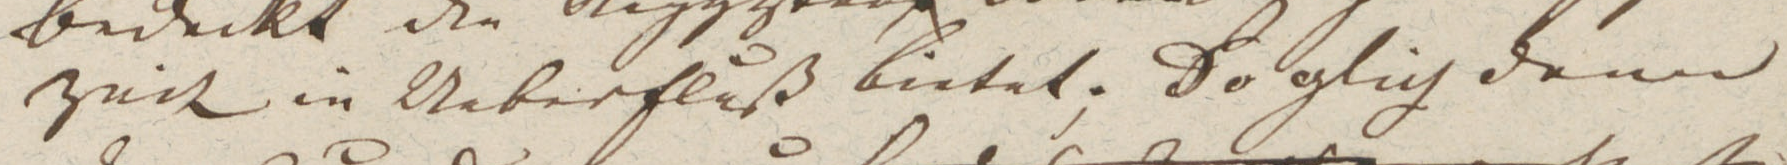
zeit in Ueberfluss bietet. Da glich denn
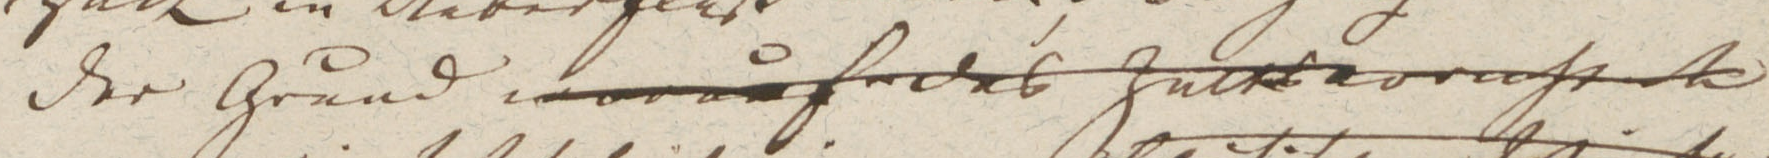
der Grund worauf das Zelt errichtet
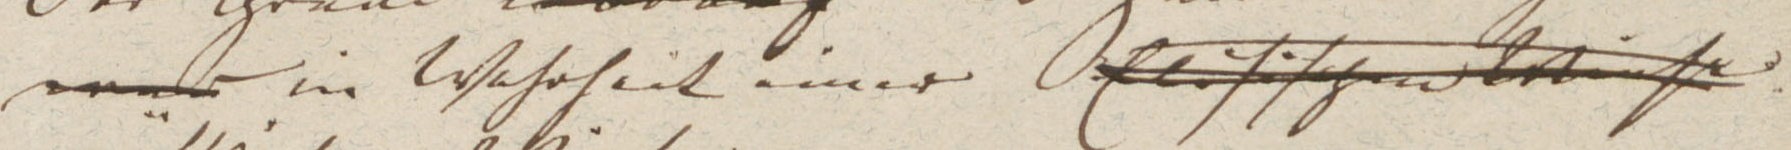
war in Wahrheit einer Elisischen Wiese
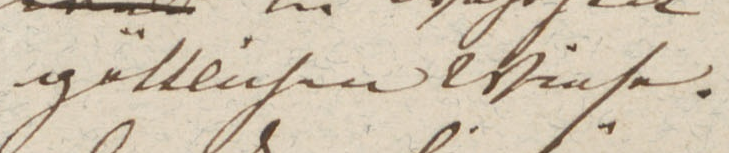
göttlichen Wiese.
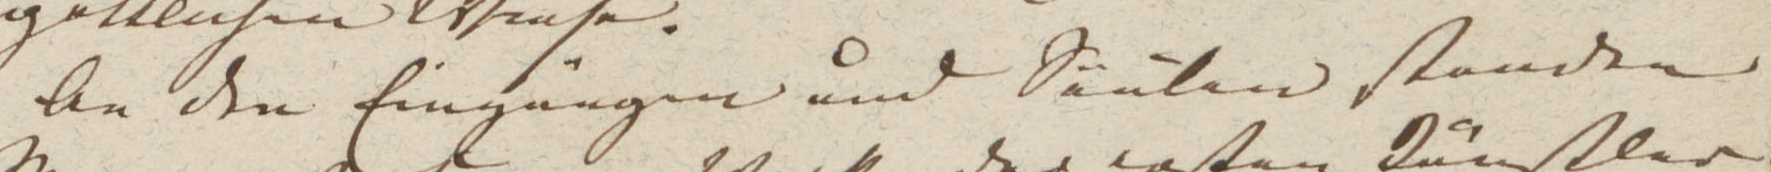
An den Eingängen und Säulen standen
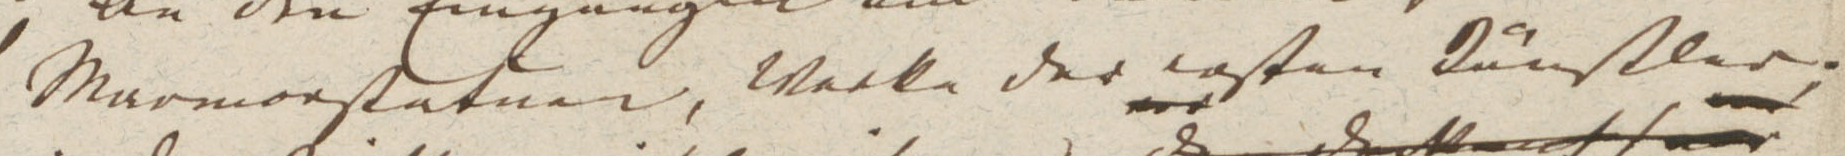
Marmorstatuen, Werke der ersten Künstler;
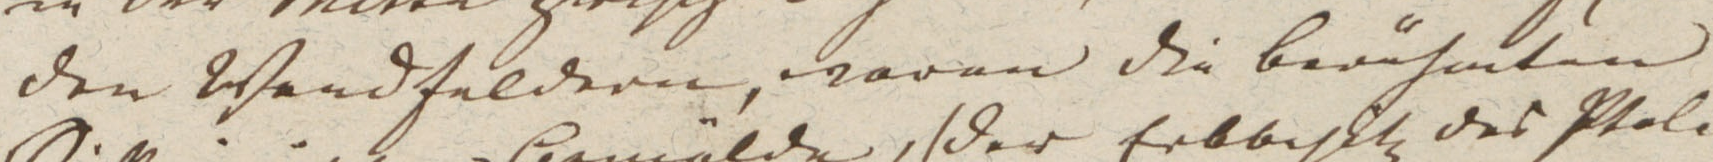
den Wandfeldern, waren die berühmten
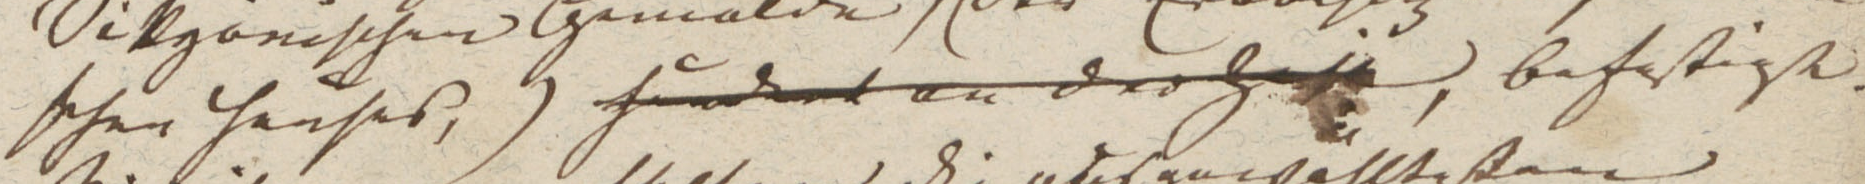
schen Hauses,) hundert an der Zahl, befestigt.
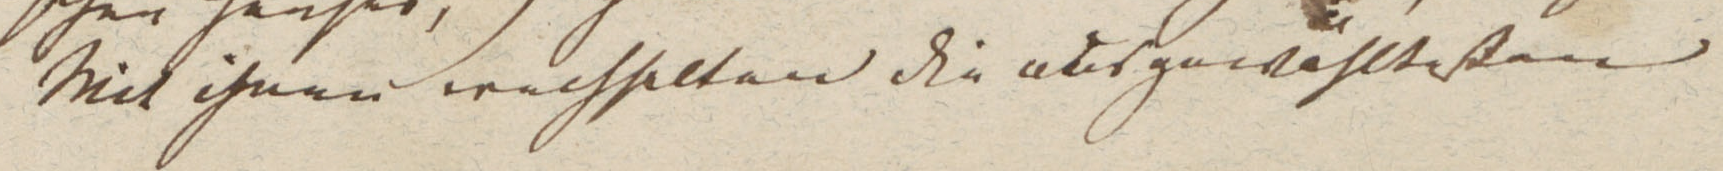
Mit ihnen wechselten die ausgewähltesten
